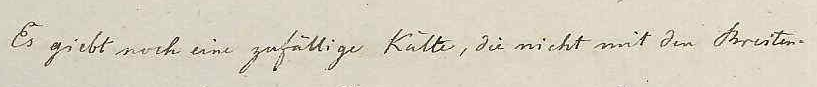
Es giebt noch eine zufällige Kälte, die nicht mit den Breiten
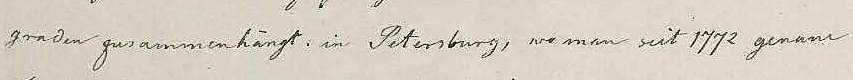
graden zusammenhängt: in Petersburg, wo man seit 1772 genaue
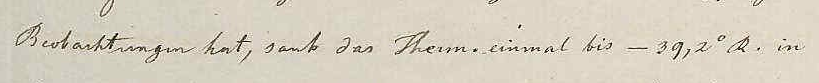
Beobachtungen hat, sank das Therm. einmal bis −39,2° R. in
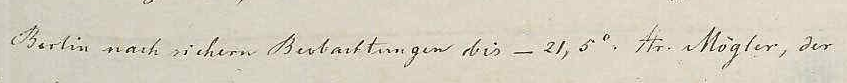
Berlin nach sichern Beobachtungen bis −21,5°. Hr. Mögler, der
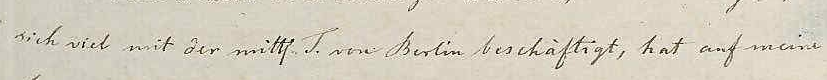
sich viel mit der mittl. T. von Berlin beschäftigt, hat auf meine
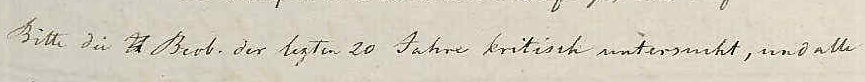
Bitte die Beob. der lezten 20 Jahre kritisch untersucht, und alle
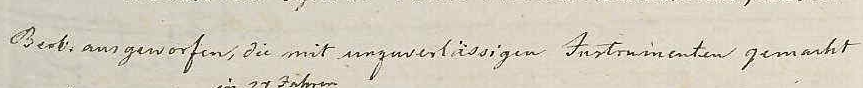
Beob. ausgeworfen, die mit unzuverlässigen Instrumenten gemacht
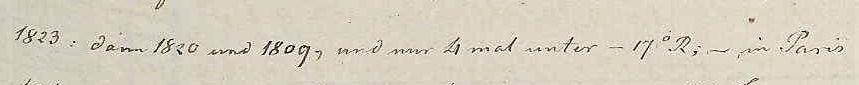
1823: dann 1820 und 1809, und nur 4 mal unter −17° R; – in Paris
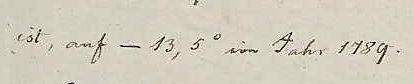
ist, auf −13,5° in Jahr 1789.
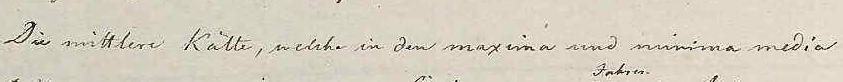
Die mittlere Kälte, welche in den maxima und minima media
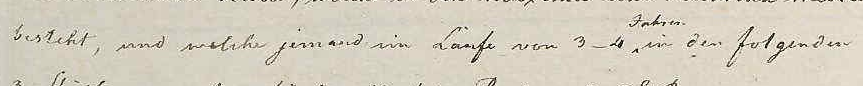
besteht, und welche jemand im Laufe von 3–4 Jahren in den folgenden
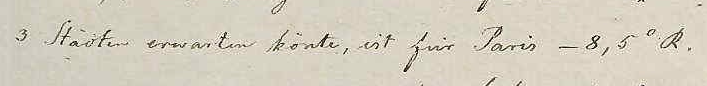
3 Städten erwarten könte, ist für Paris −8,5° R.
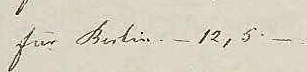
für Berlin −12,5· ―
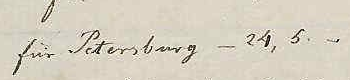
für Petersburg −24,5· ―
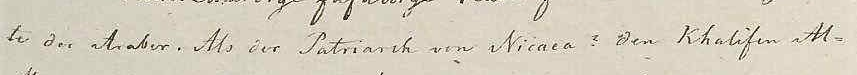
te der Araber. Als der Patriarch von Nicaea ? den Khalifen Al-
